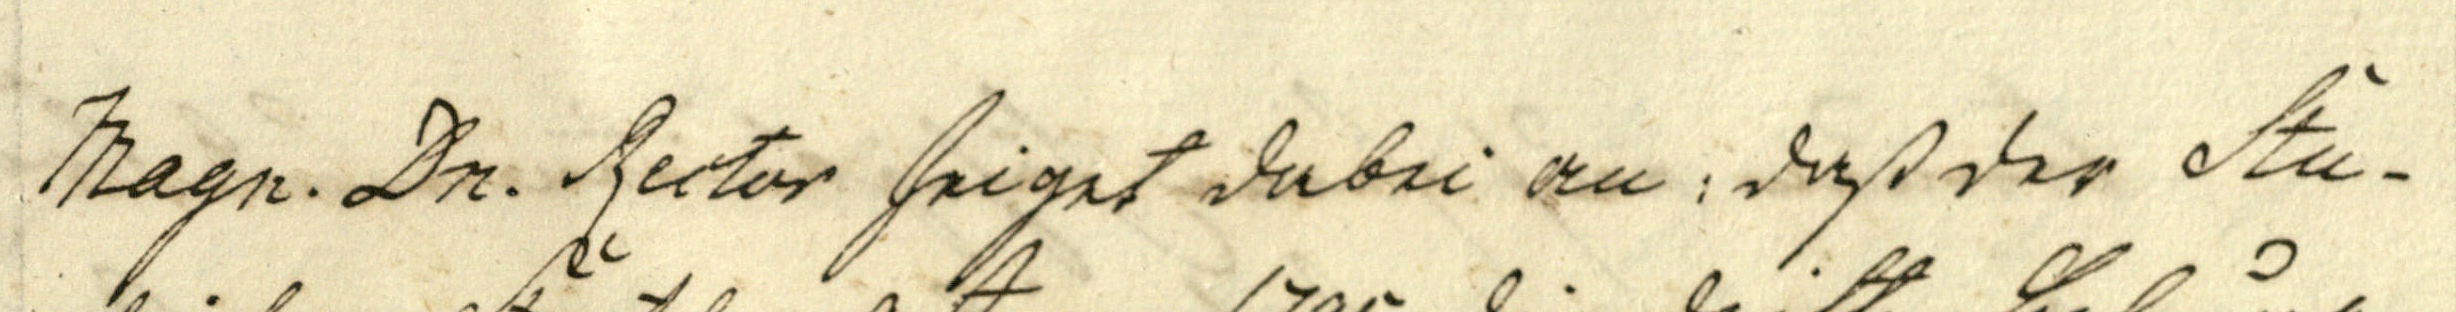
Magn. Dn. Rector zeiget dabei an: daß der Stu¬
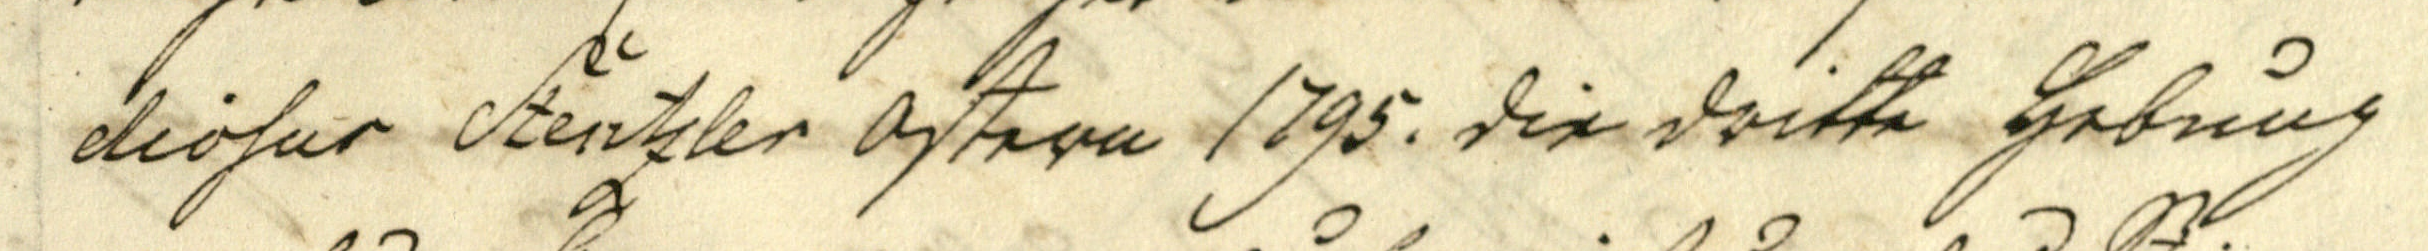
diosus Stentzler Ostern 1795. die dritte Hebung
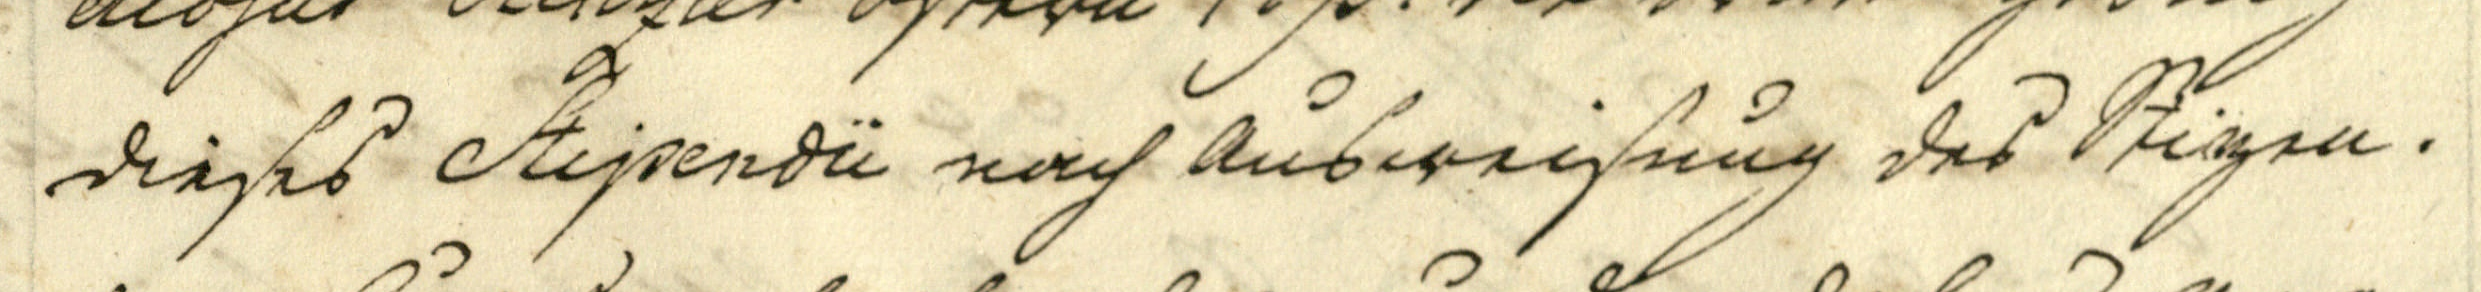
dieses Stipendii nach Ausweisung des Stipen¬
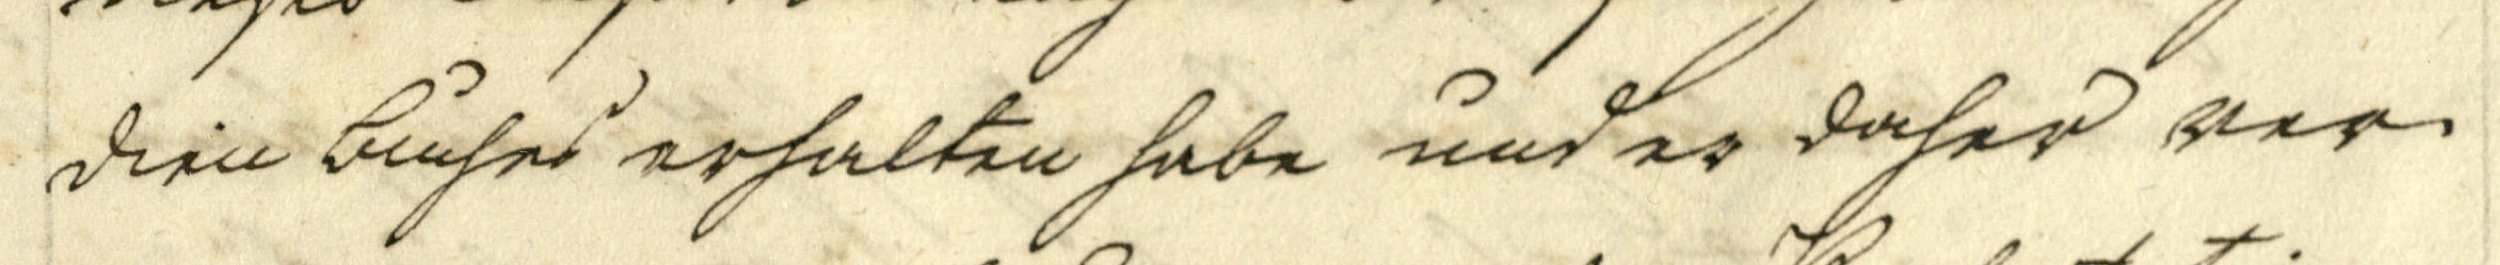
dien Buches erhalten habe und er daher ver¬
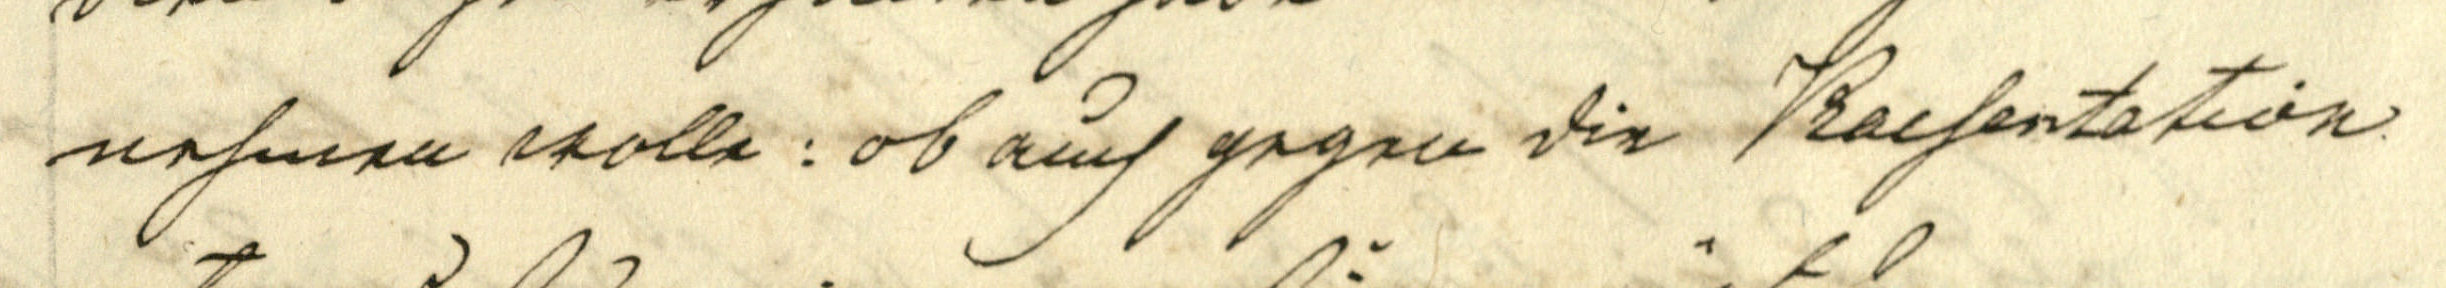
nehmen wolle: ob auch gegen die Praesentation
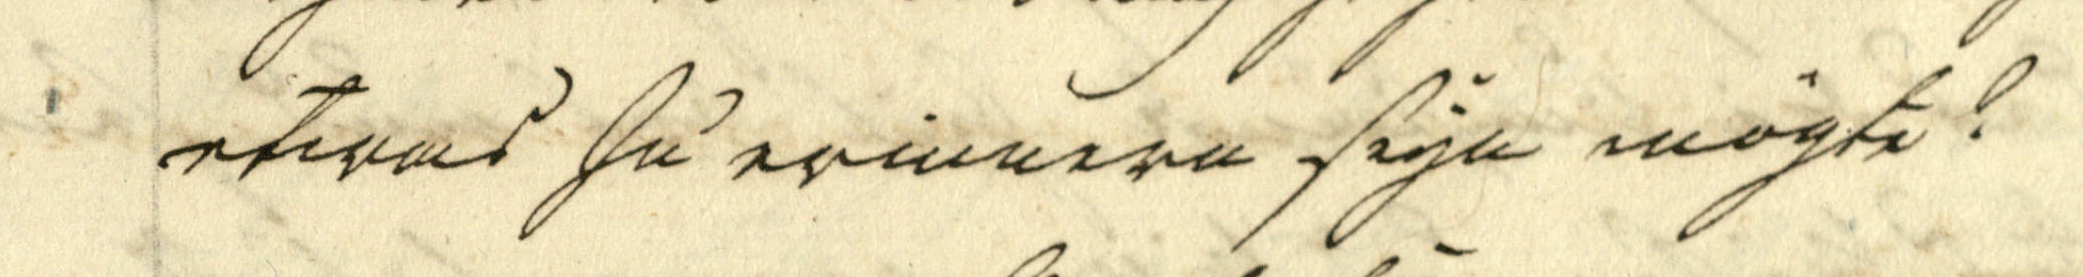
etwas zu erinnern seÿn mögte?
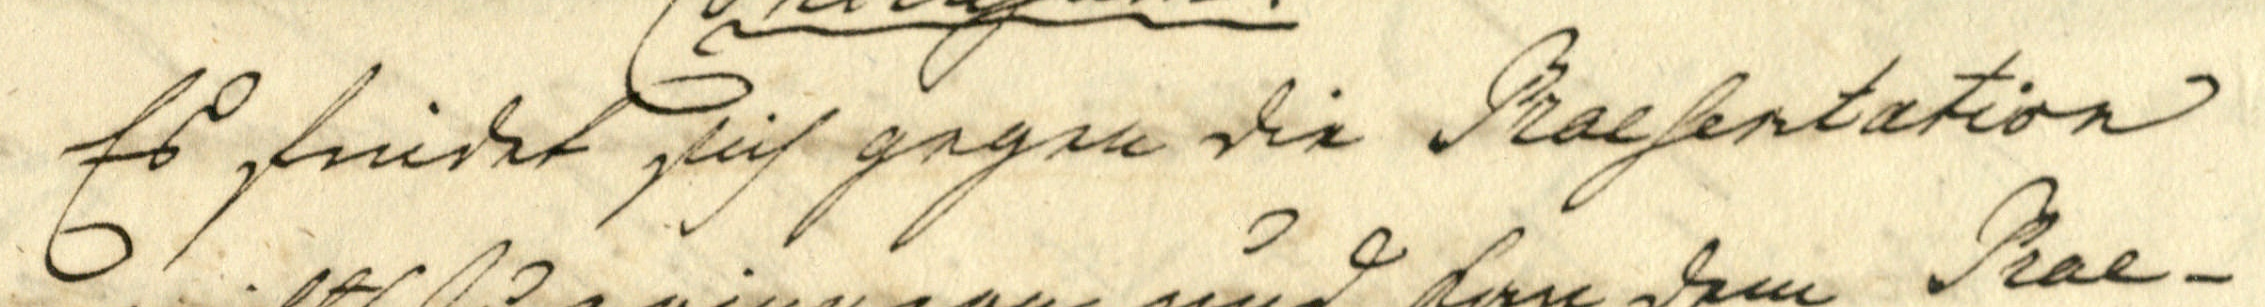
Es findet sich gegen die Praesentation
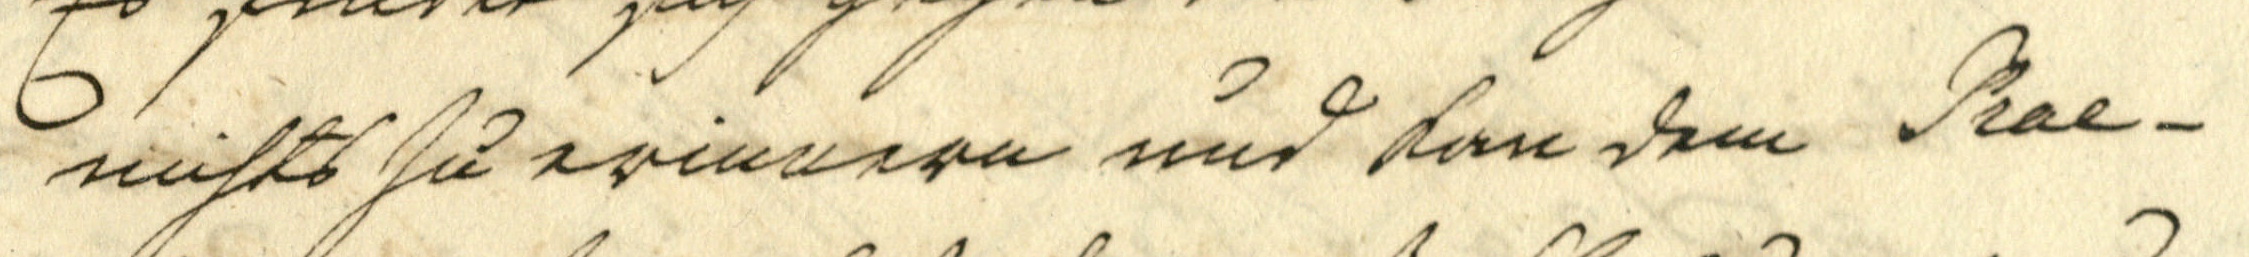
nichts zu erinnern und kan dem Prae¬
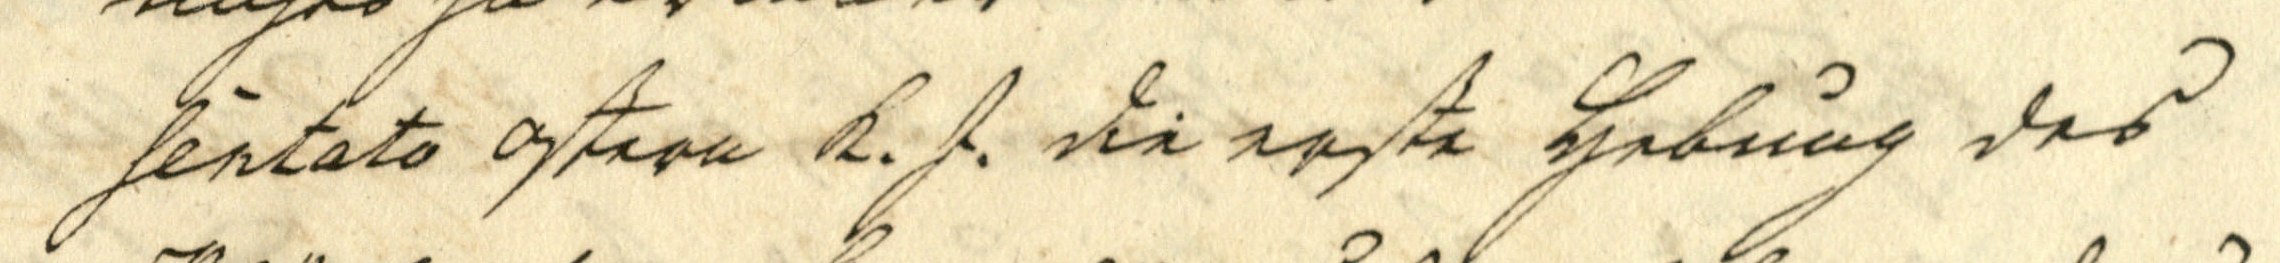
sentato Ostern K. J. die erste Hebung des
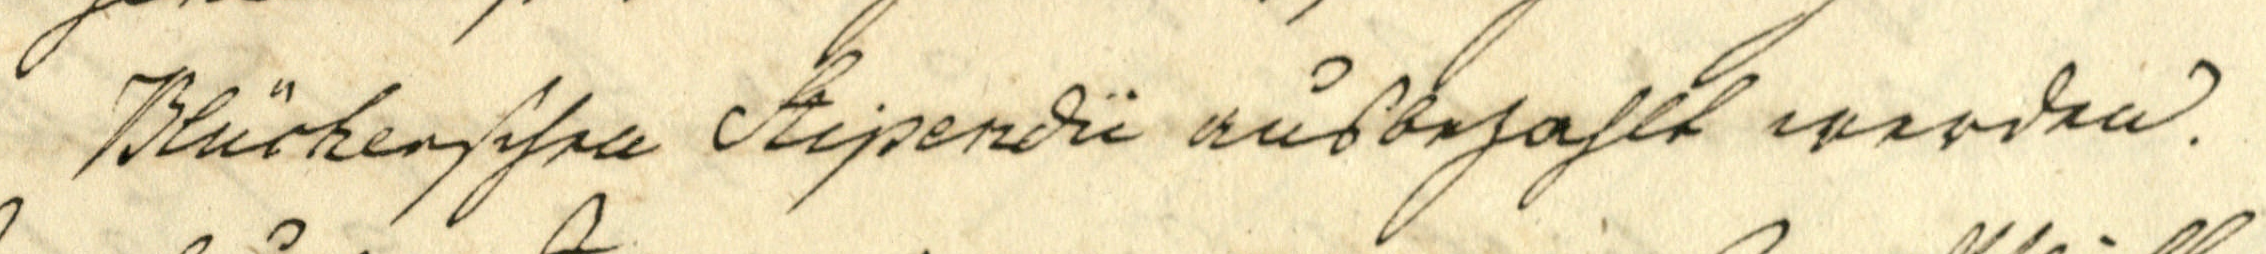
Blücherschen Stipendii ausbezahlt werden.
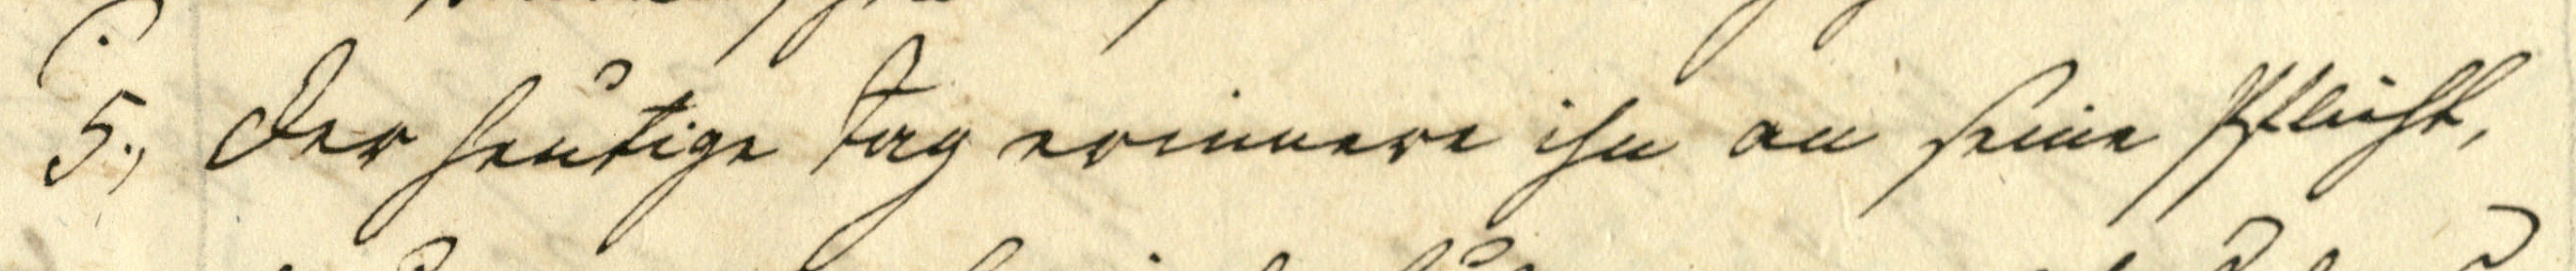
5., Der heutige Tag erinnere ihn an seine Pflicht,
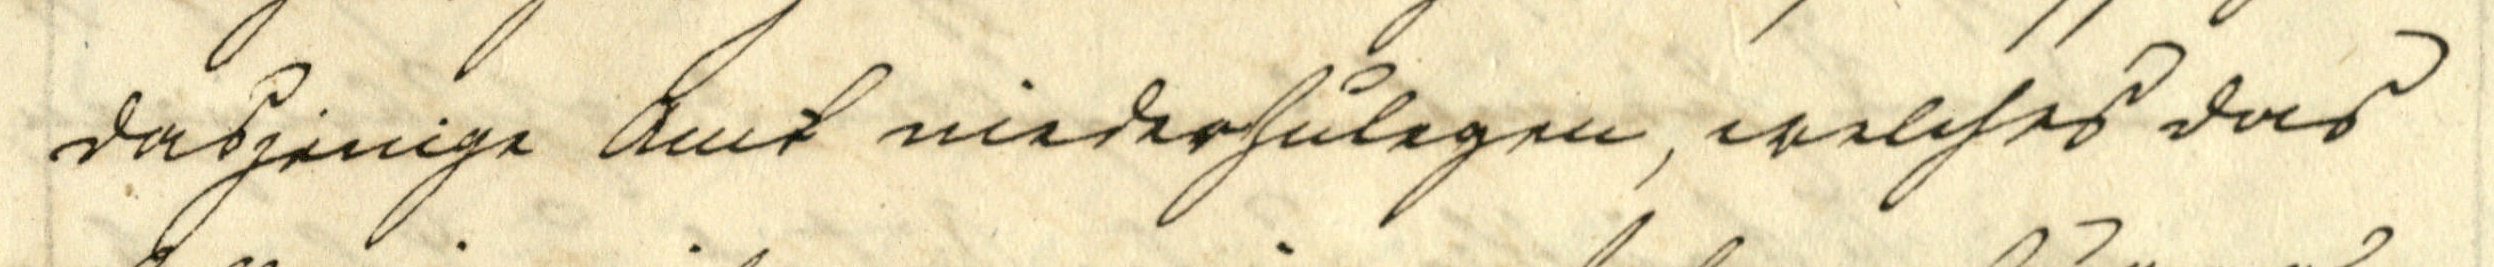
dasjenige Amt niederzulegen, welches das
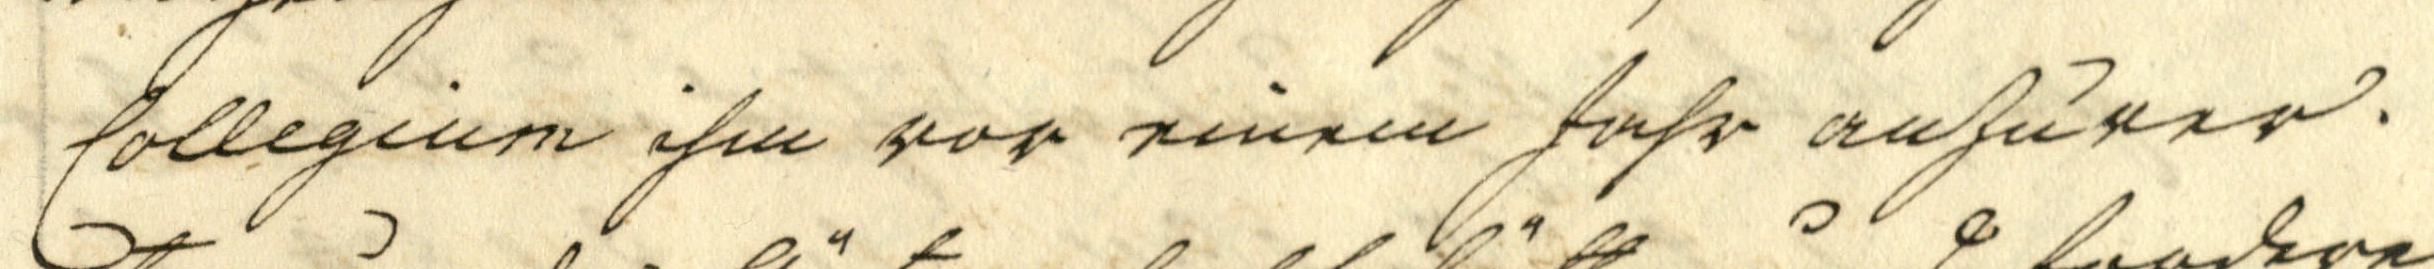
Collegium ihm vor einem Jahr anzuver¬
